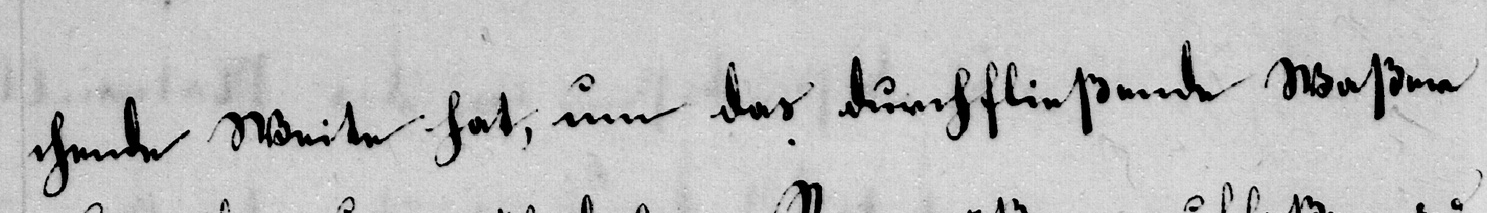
chende Weite hat, um das durchfließende Waßer
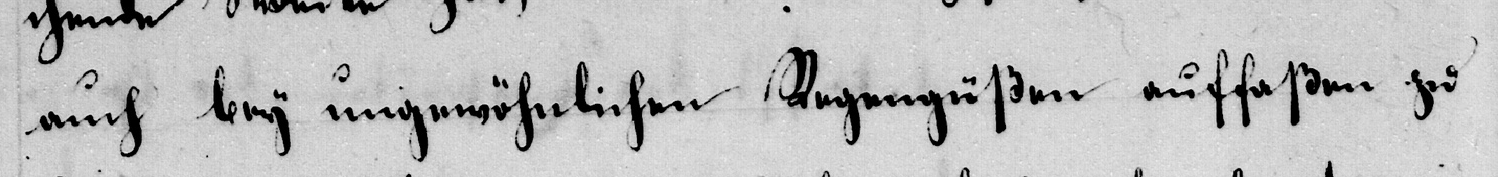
auch bey ungewöhnlichen Regengüßen auffaßen zu
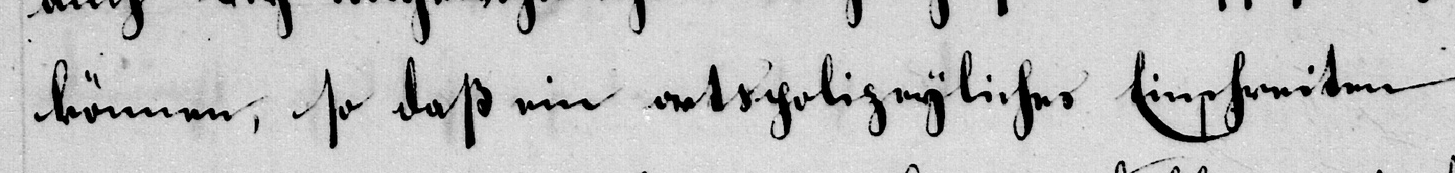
können, so daß ein ortspolizeyliches Einschreiten
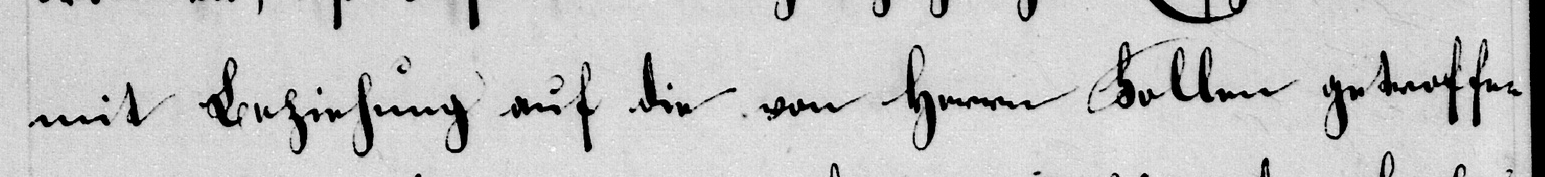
mit Beziehung auf die von Herrn Follen getroffe¬
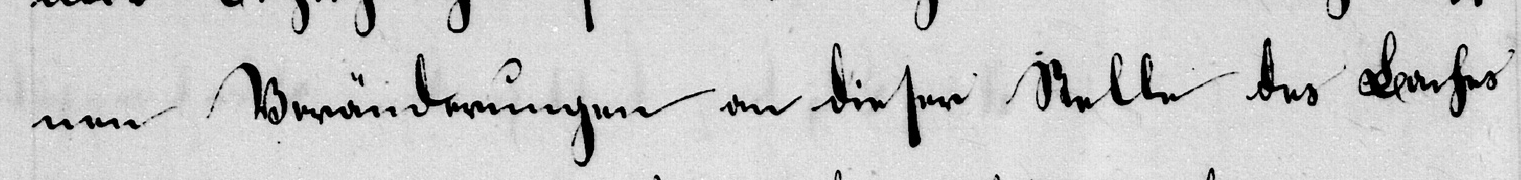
nen Veränderungen an dieser Stelle des Baches
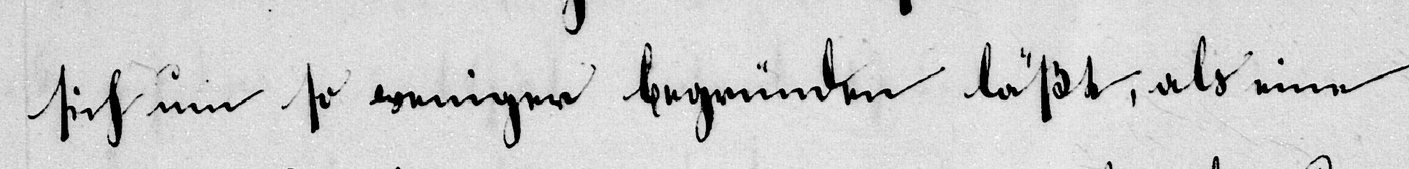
sich um so weniger begründen läßt, als eine
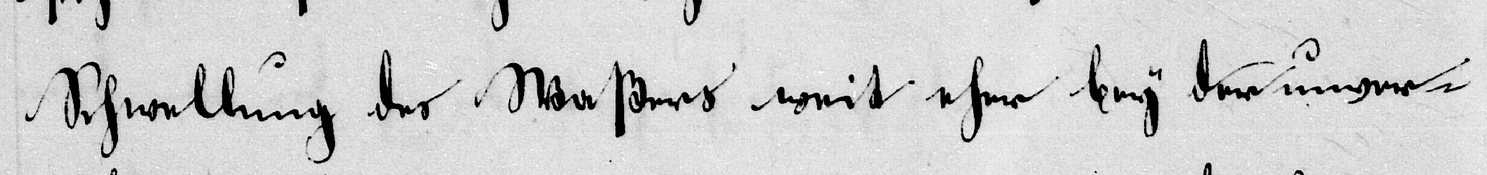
Schwellung des Waßers weit eher bey der unver¬
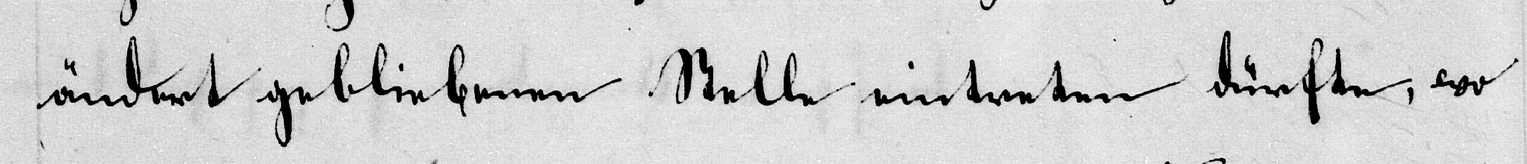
ändert gebliebenen Stelle eintreten dürfte, wo
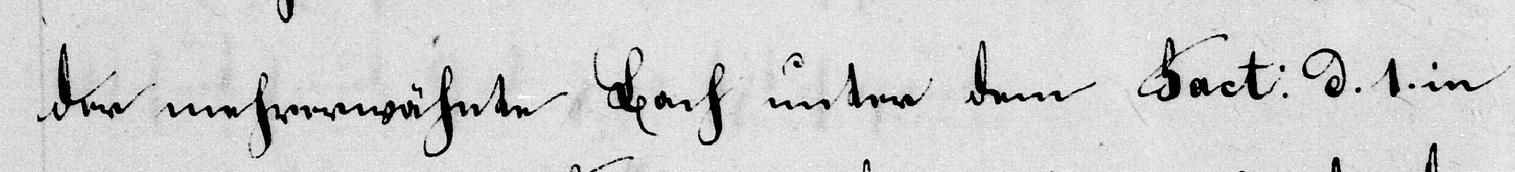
der mehrerwähnte Bach unter dem Fact: d. 1. in
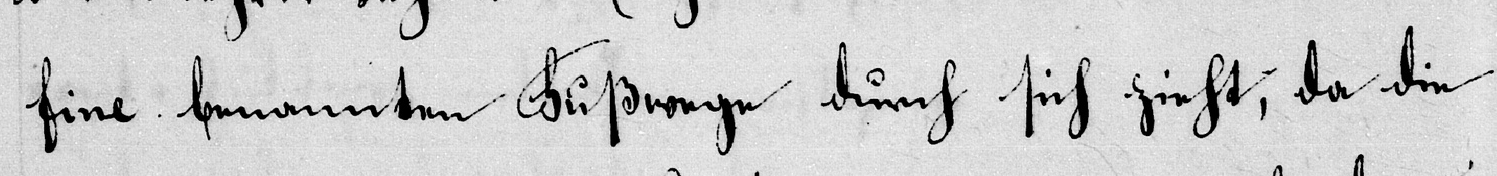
fine benannten Fußwege durch sich zieht, da die
